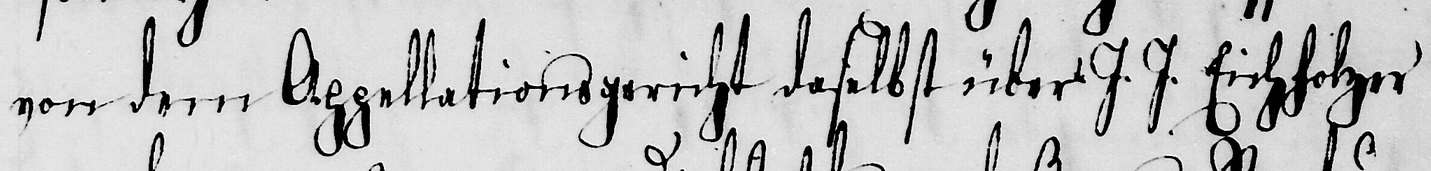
von dem Appellationsgericht daselbst über J. J. Eichholzer
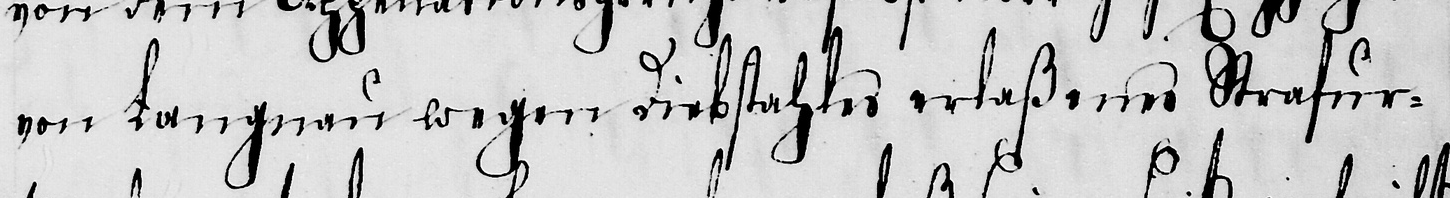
von Langnau wegen Diebstahles erlaßenes Strafur¬
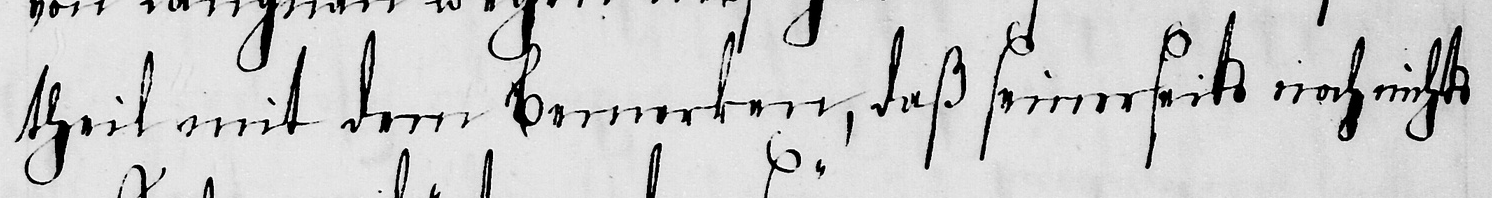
theil mit dem Bemerken, daß seinerseits noch nichts
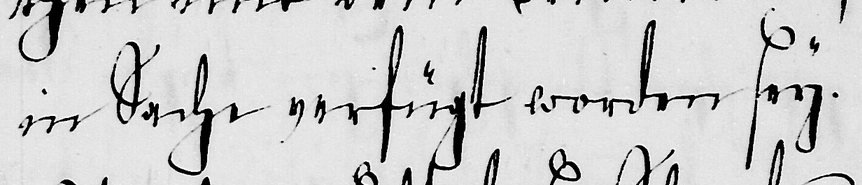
in Sache verfügt worden sey.
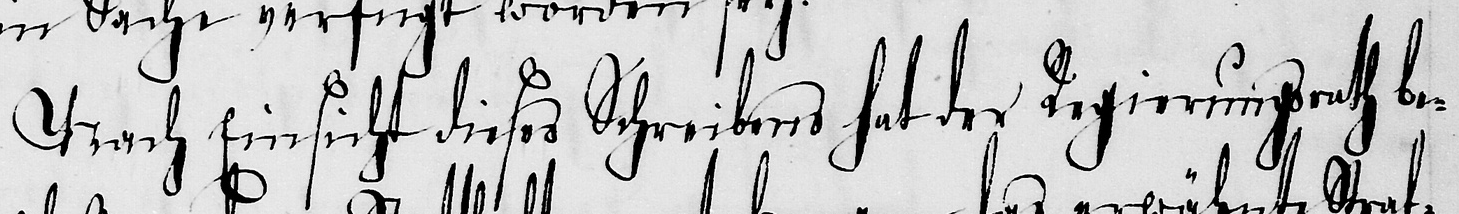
Nach Einsicht dieses Schreibens hat der Regierungsrath be¬
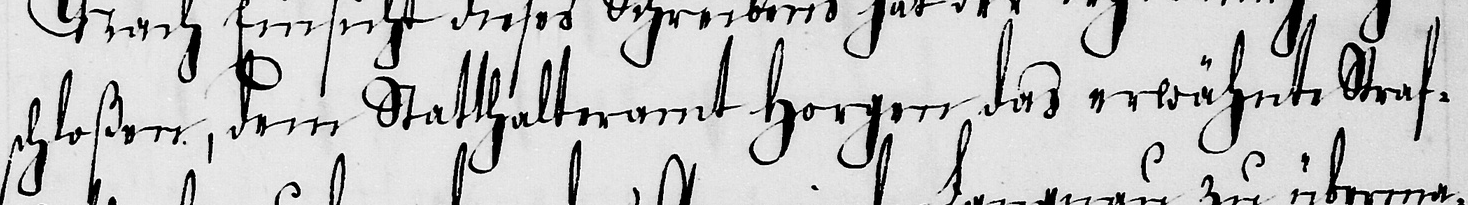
schloßen, dem Statthalteramt Horgen das erwähnte Straf¬
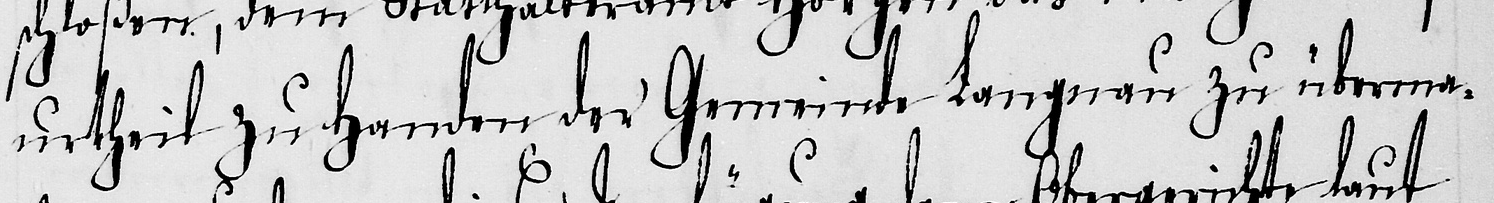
urtheil zu Handen der Gemeinde Langnau zu überma¬
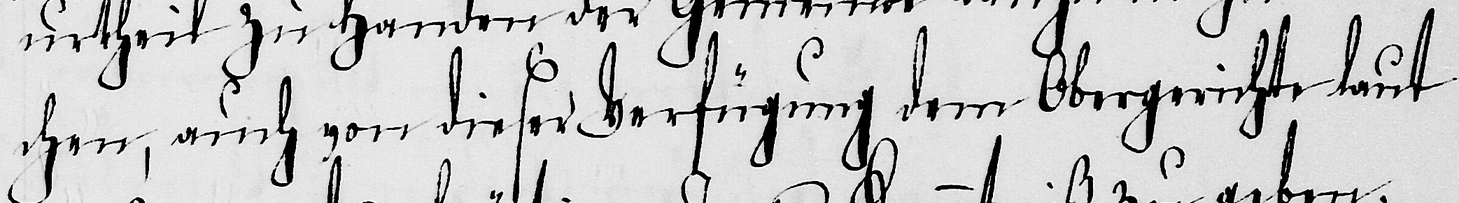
chen, auch von dieser Verfügung dem Obergerichte laut
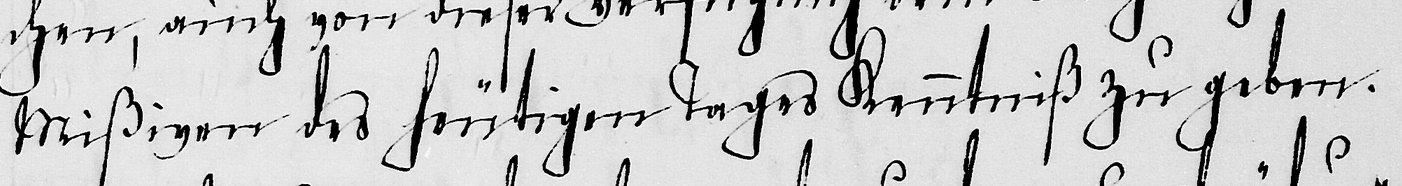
Mißiven des heutigen Tages Kenntniß zu geben.
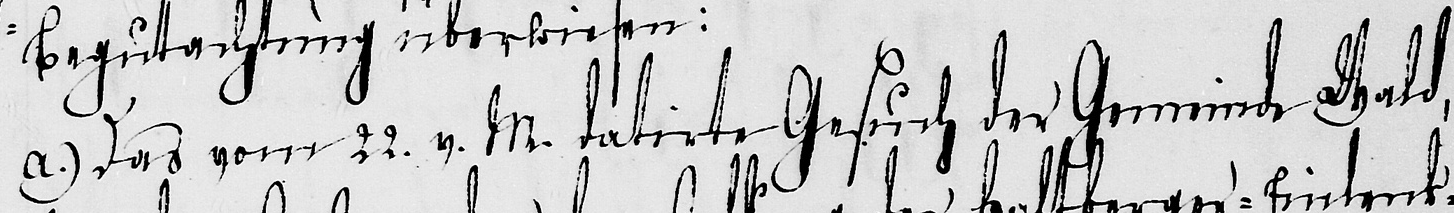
a.) Das vom 22. v. M. datirte Gesuch der Gemeinde Wald,
